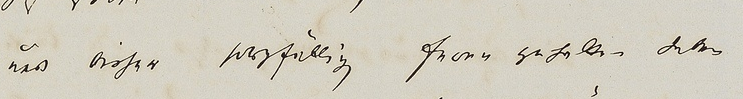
uns bisher sorgfältig ferne gehalten haben
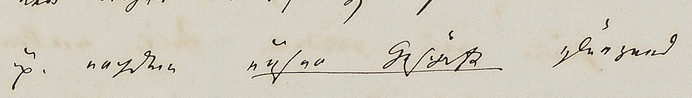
&. nachdem unser Geschäft glänzend
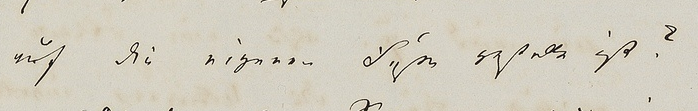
auf die eigenen Füße gestellt ist?
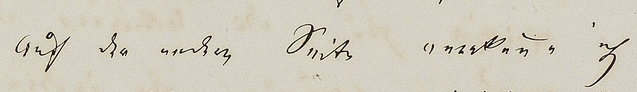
Auf der andern Seite anerkenne ich
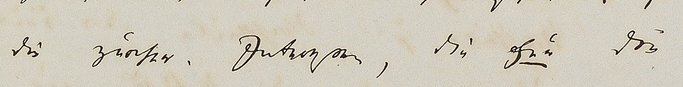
die zürcher. Interessen, die für die
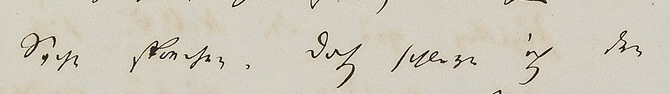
Sache sprechen. Doch schlage ich den
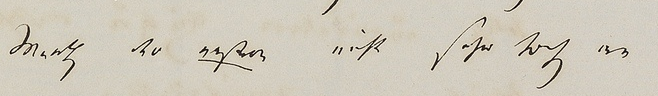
Werth der ersten nicht sehr hoch an
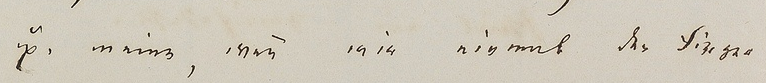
&. meine, wenn wir einmal den Finger
